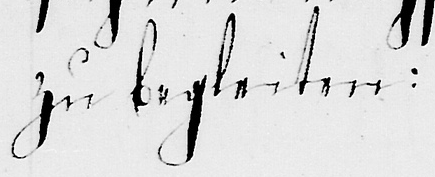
zu begleiten:
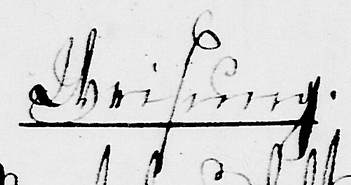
Weisung.
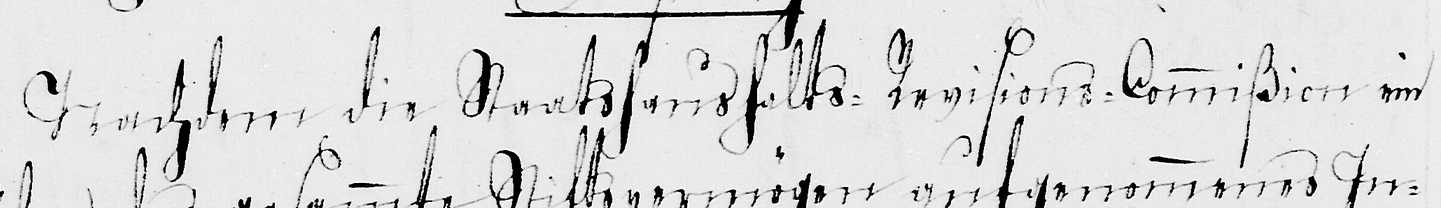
Nachdem die Staatshaushalts-Revisions-Commißion ein
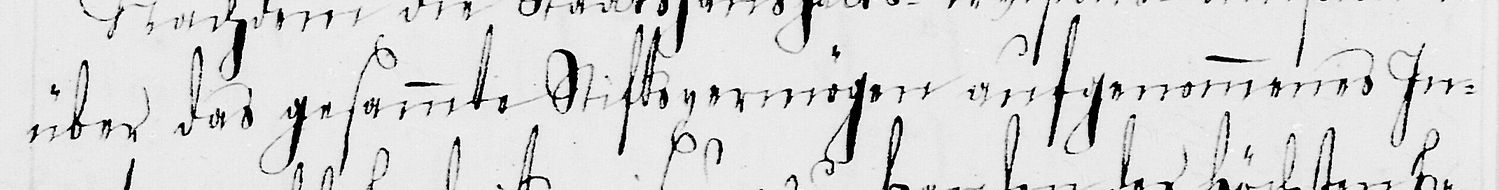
über das gesammte Stiftsvermögen aufgenommenes In¬
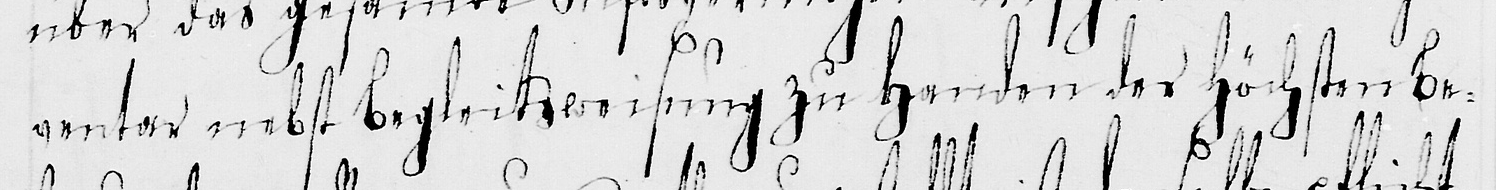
ventar nebst Begleitsweisung zu Handen der Höchsten Be¬
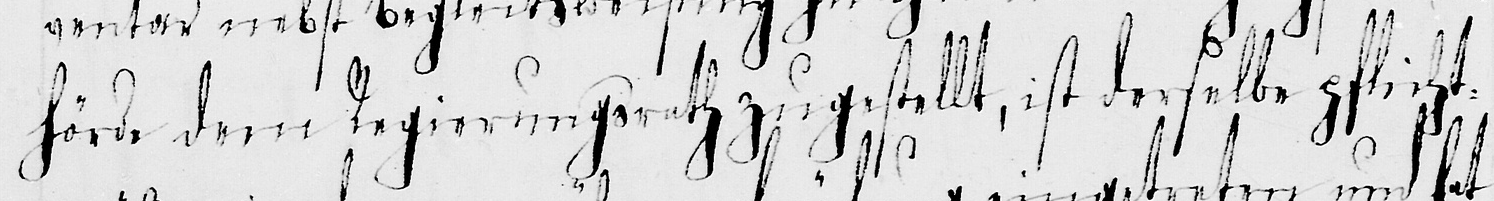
hörde dem Regierungsrath zugestellt, ist derselbe pflich¬
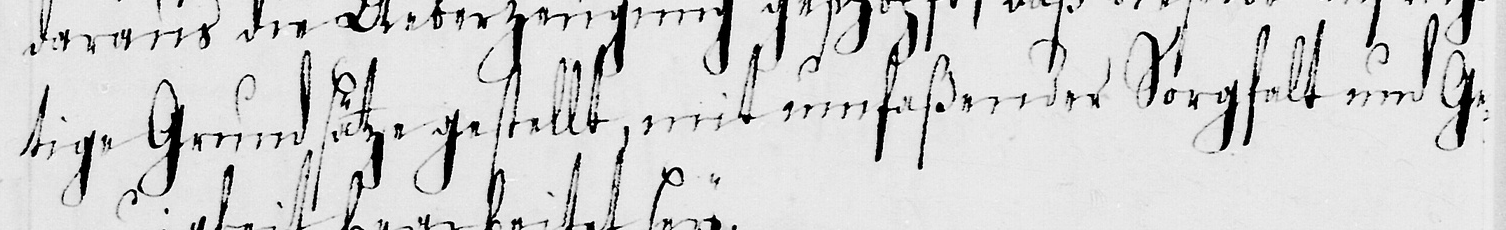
tige Grundsätze gestellt, mit umfaßender Sorgfalt und Ge¬
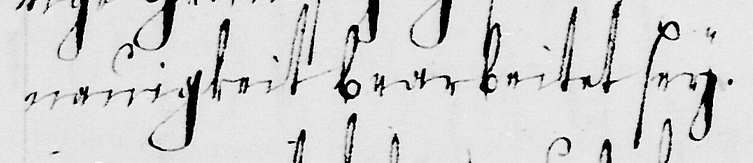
nauigkeit bearbeitet sey.
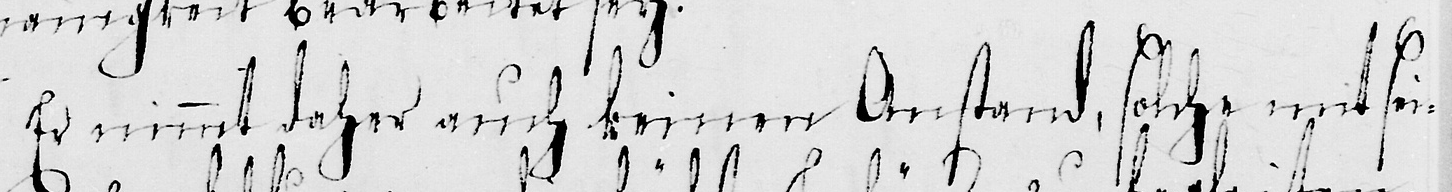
Er nimmt daher auch keinen Anstand, solche mit sei¬
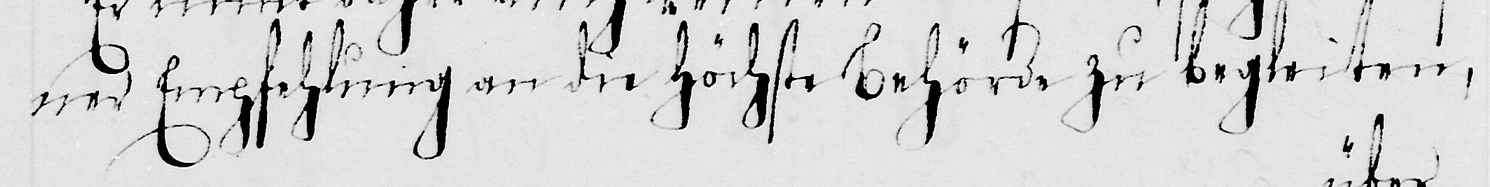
ner Empfehlung an die Höchste Behörde zu begleiten,
